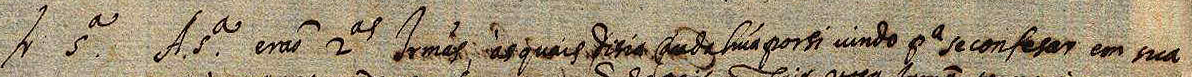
item 5a. A 5.a eraõ 2as Irmās, às quais disia a cada huā por si uindo pa se confesar em sua
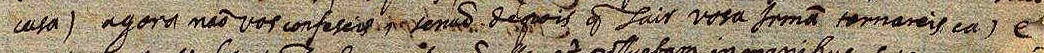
casa / agora naõ vos confeseis, senaõ depois q̄ sair vosa Jrmā tornareis ca / e
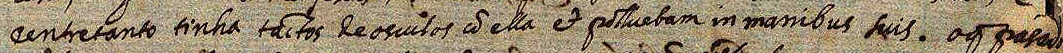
e entretanto tinha tactos de osculos cō ella & polluebam in manibus suis. o q̄ pasado
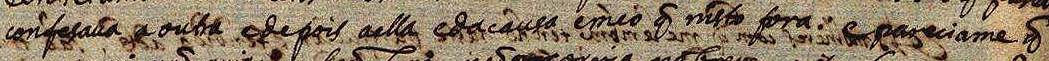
confesaua a outra e depois a ella e da causa e meo q̄ nisto fora. e pareciame q̄
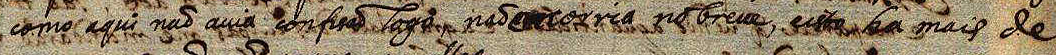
como aqui naõ auia confisaõ logo, naõ encorria no breue, e isto ha mais de
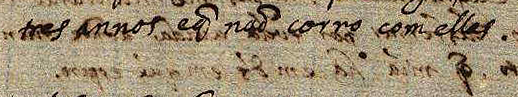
tres annos e q̄ naõ corro com ellas.
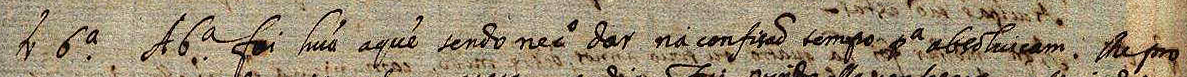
item 6a. A 6.a foi huā a quē sendo neco dar na confisaõ tempo pa absoluiçam lhe pro
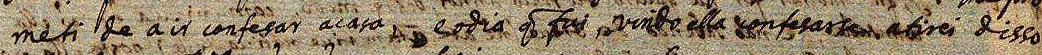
meti de a ir confesar a casa, e o dia q̄ fui, vindo ella confesarse a tirei disso
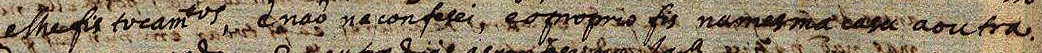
e lhe fis tocamtos, e naõ na confesei, e o proprio fis na mesma casa a outra
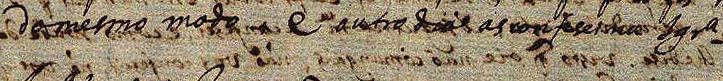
do mesmo modo e outro dia as confesei na Igra.
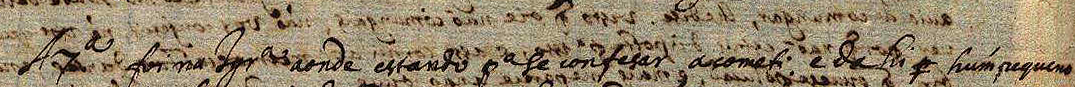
A 7.a foi na Igra aonde estando pa se confesar a cometi, e dahi ꝑ hum̄ pequeno
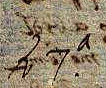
item 7.a
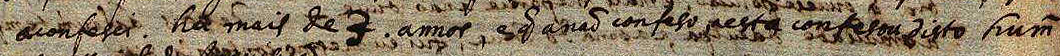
a confesei ha mais de 3 annos, e q̄ a naõ confeso a esta confesou disto hum̄
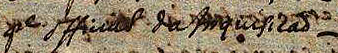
pe official da Inquisiçaõ -
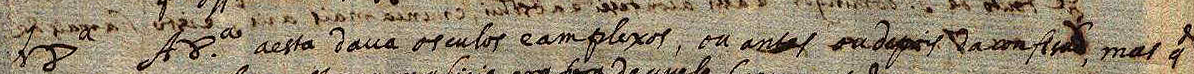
item 8a A 8.a a esta daua osculos e amplexos, ou antes ou depois da confisaõ, mas qdo
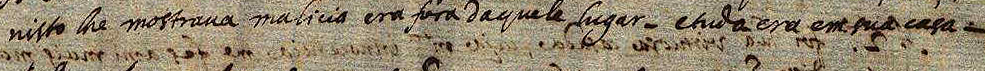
nisto lhe mostraua malicia era fora daquele lugar - e tudo era em sua casa -
